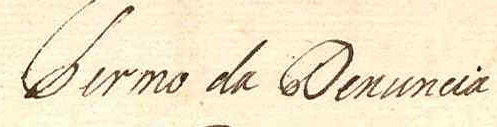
Termo da Denuncia
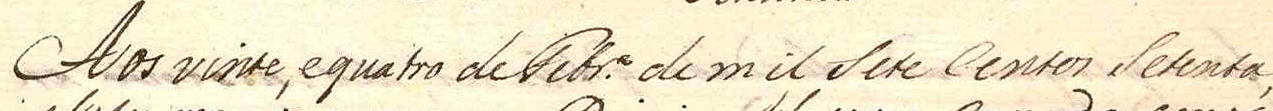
Aos vinte, e quatro de Febr.o de mil seteCentos setenta,
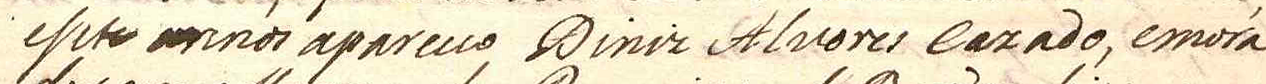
e sete annos apareceo Diniz Alvores cazado, e mora
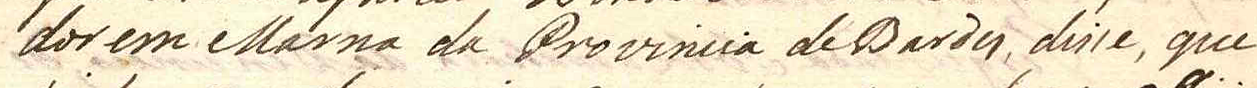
dor em Marna da Provincia de Bardes, disse, que
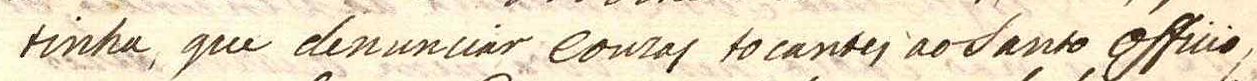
tinha, que denunciar couzas tocantes ao Santo Officio,
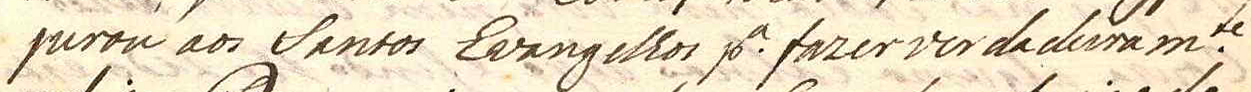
jurou aos Santos Evangelhos p.a fazer verdadeiram.te
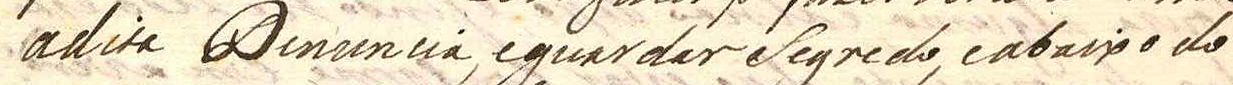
a dita Denuncia, e guardar Segredo, e abaixo do
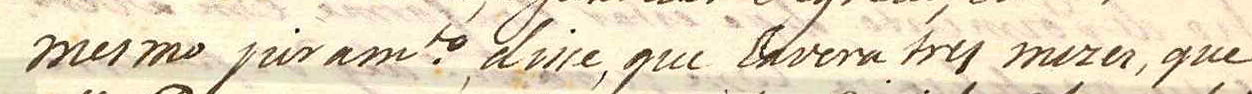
mesmo juram.to, disse, que haverá tres mezes, que
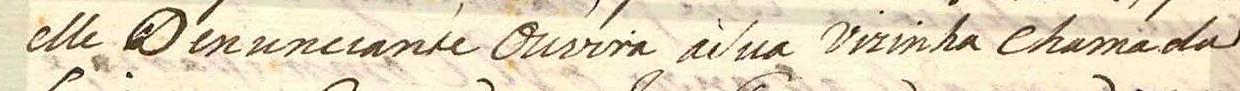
elle Denunciante Ouvira a sua vizinha chamada
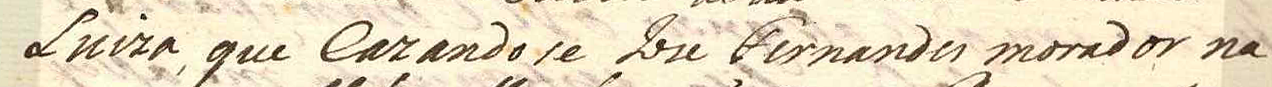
Luiza, que Cazandose Ioze Fernandes morador na
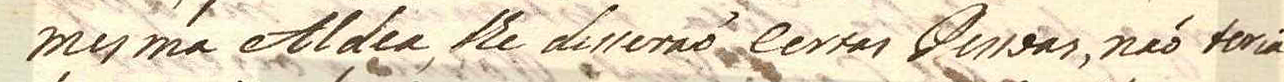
mesma Aldea, lhe disseraõ certas Pessoas, naõ teria
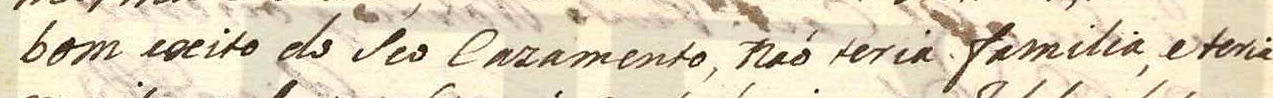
bom exito do seo Cazamento, naõ teria familia, e teria
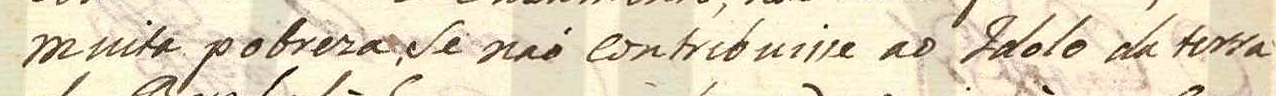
muita pobreza, se naõ contribuisse ao Idolo da terra
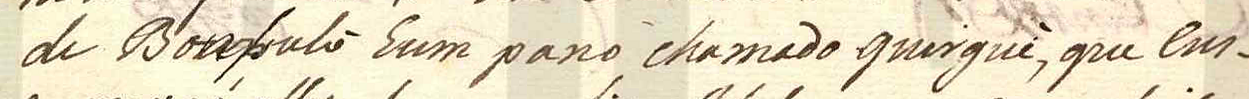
de Bo__ulo hum pano chamado quergue, que cus
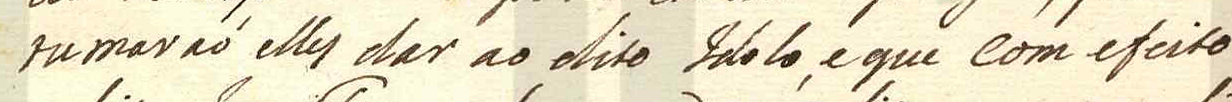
tumavaõ elles dar ao dito Idolo, e que com efeito
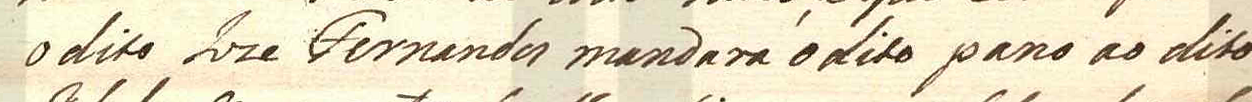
o dito Ioze Fernandes mandara o dito pano ao dito
